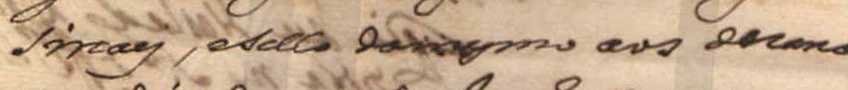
sinaes, e sello do mesmo aos dezano
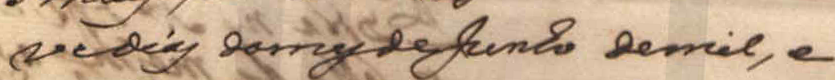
ve dias do mes de Junho de mil, e
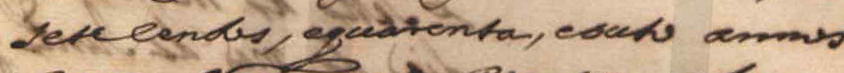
setecentos, e quarenta, e outo annos
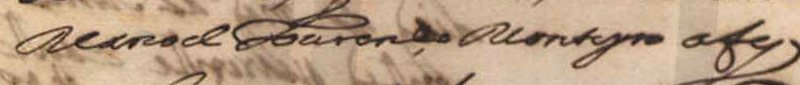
Manoel Lourenço Monteyro a fes
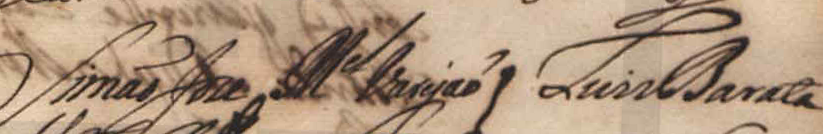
Simaõ Joze M.el Varejaõ Luiz Barata
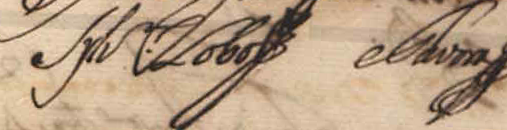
Sylvrꝭ. Lobo e Tavora
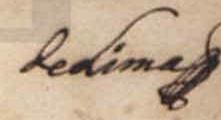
de Lima
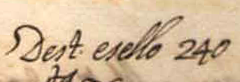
Dest. e sello 240.
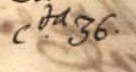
c.ta 36.
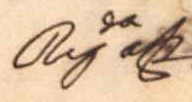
Regda a fl
